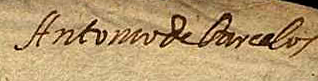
Antonio de barcelos
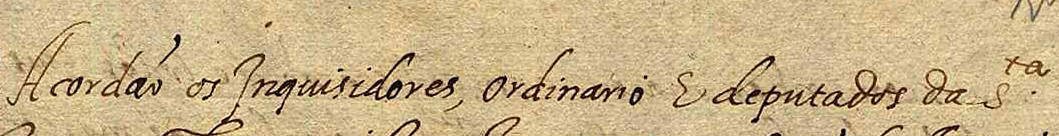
Acordaõ os Jnquisidores, ordinario E deputados da sta.
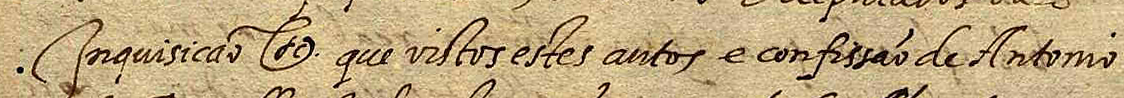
Jnquisição Etc̄. que vistos estes autos e confissaõ de Antonio
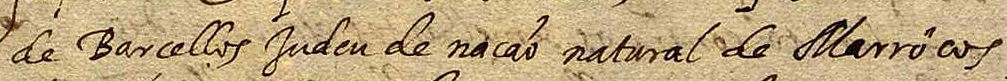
de Barcellos Judeu de naçaõ natural de Marrôcos
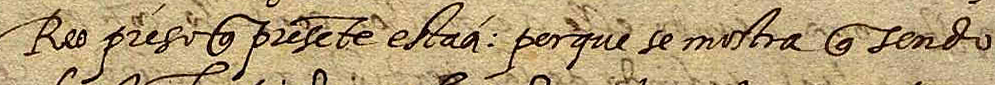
Reo preso q̄ presēte estaá: per que se mostra q̄ sendo
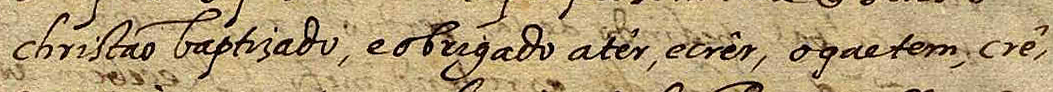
christao baptizado, e obrigado a têr, e crêr, o que tem, crê,
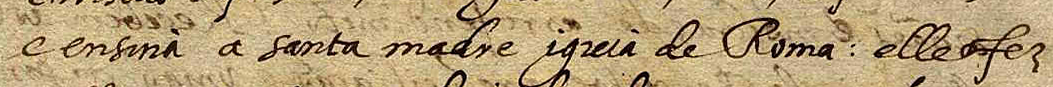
e ensina a santa madre igreia de Roma: elle o fez
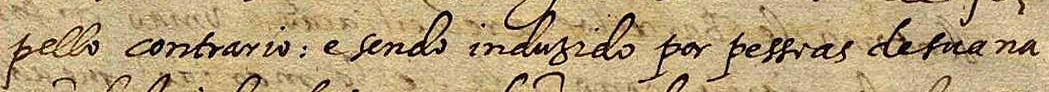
pello contrario: e sendo induzido por pessoas de sua na
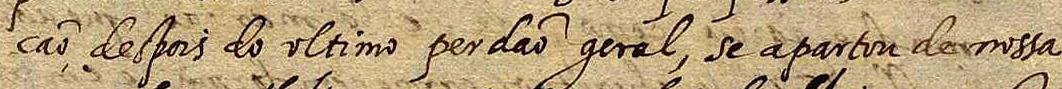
caõ, despois do vltimo perdaõ geral, se apartou de nossa
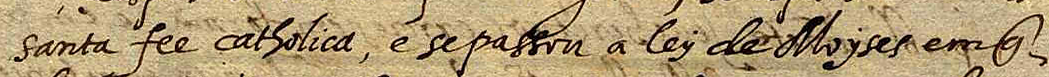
santa fee catholica, e se passou a ley de Moyses em q̄
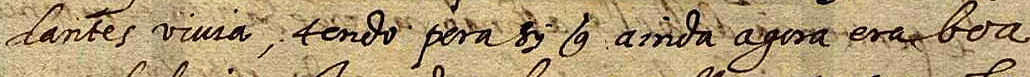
dantes viuia, tendo pera sy q̄ ainda agora era boa
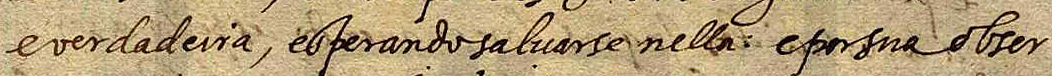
e verdadeira, esperando saluarse nella: e por sua obser
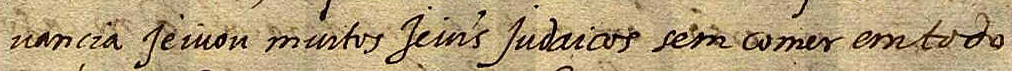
uançia Jeiuou muitos Jeiūs Judaicos sem comer em todo
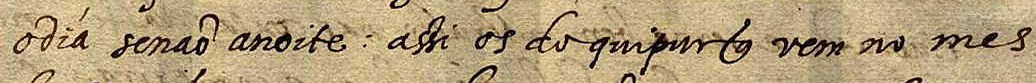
o dia senaõ a noite: assi os do quipur q̄ vem no mes
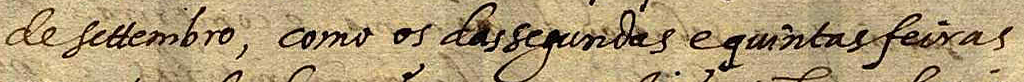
de settembro, como os das segundas e quintas feiras
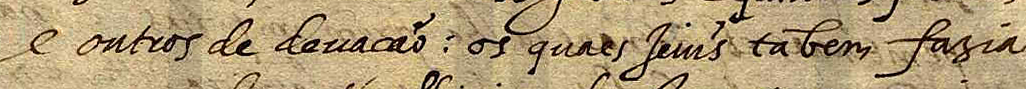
e outros de deuoçaõ: os quaes Jeiūs tābem fazia
